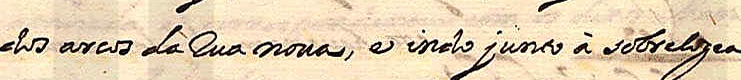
dos arcos da Rua noua, e indo junto à sobrelogea
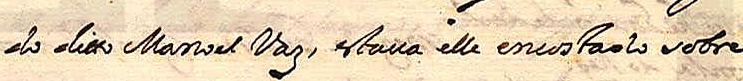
do ditto Manoel Vaz, estaua elle encostado sobre
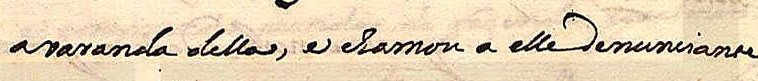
a varanda della, e chamou a elle denunciante
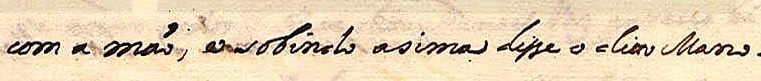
com a maõ, e sobindo asima disse o ditto Mano
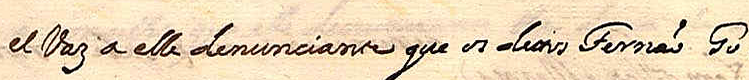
el Vaz a elle denunciante que os dittos Fernaõ Go
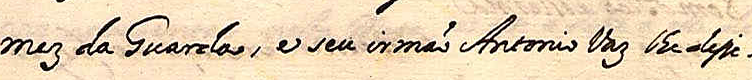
mez da Guarda, e seu irmaõ Antonio Vaz lhe disse
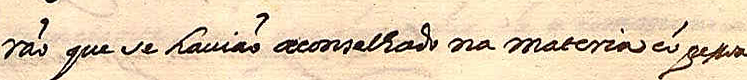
raõ que se hauião aconselhado na materia cō pessoa
